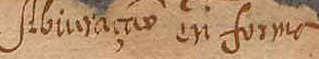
Abiuração en̄ forma
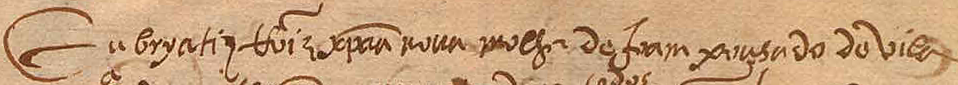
Eu bryatiz Roīz xpāa noua molher de Joam pousado de Vila
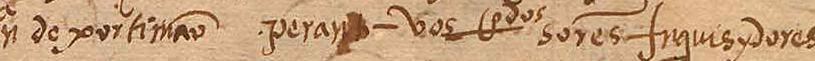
na de portimão .perante vos Rdos sor̄es Jnquisydores
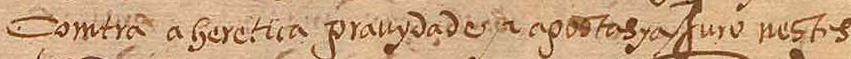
Comtra a heretica prauydade e apostasya / Juro nestes
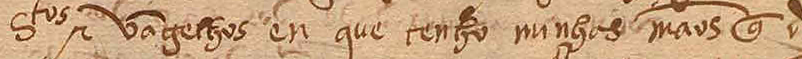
Stos evāgelhos en que tenho minhas mãos q̄ de
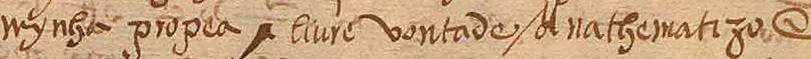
mynha propea e liure vontade / Anathematizo e
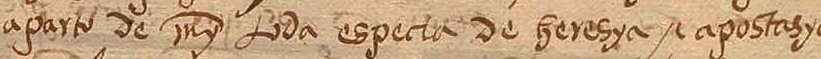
aparto de m̄y toda especia de heresya e apostasya
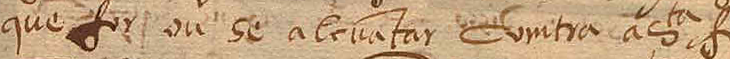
que for ou se aleuātar Comtra a Sta fee
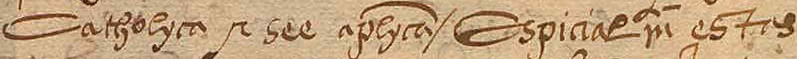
Catholyca e see ap̄lyca / Espicialmte estas
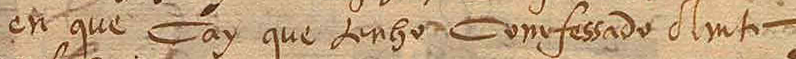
en que Cay que tenho Comfessado Amte
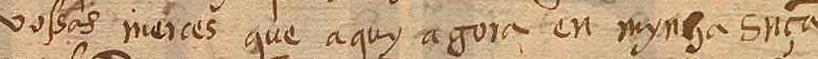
vossas merces que aquy agora en mynha Snç̄a
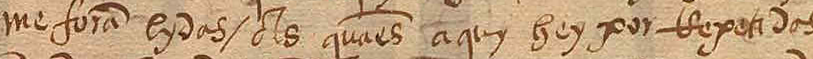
me for̄a lydas / As quāes aquy hey por Repetidas
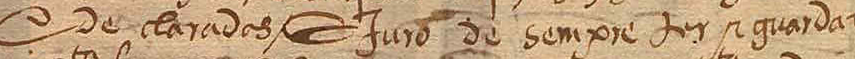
e declaradas / E Juro de sempre ter e guardar
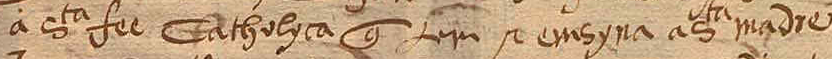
a Sta fee Catholyca q̄ tem e emsyna a Sta madre
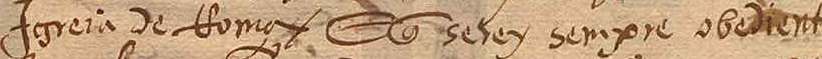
Jgreia de Roma / E q̄ serey sempre obediente
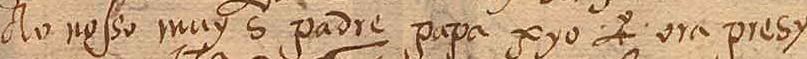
Ao nosso muy sto padre papa pyo 4o ora presy
